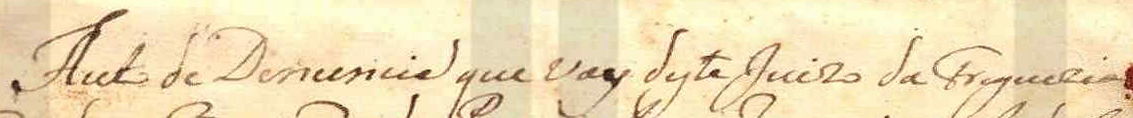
Auto de Denuncia que vay deste Juizo da Freguezia
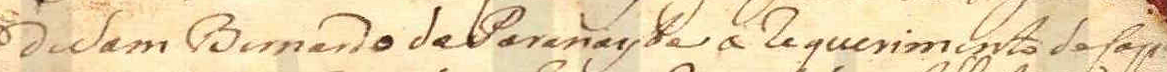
de Sam Bernardo da Paranayba a Requerimento do Capi
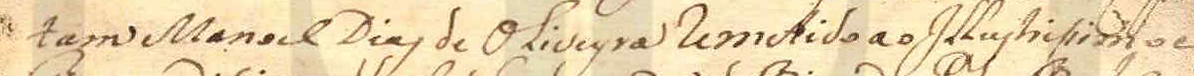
tam Manoel Dias de OLiveyra Remetido ao Jllustrissimo e
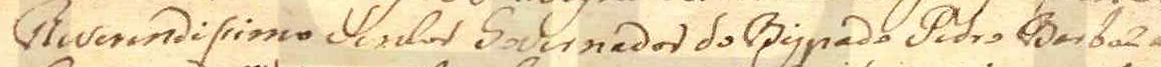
Reverendissimo Senhor Governador do Bispado Pedro Barboza
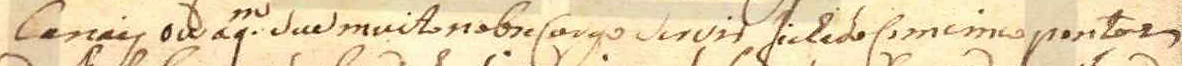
Canais ou a q.m seu muito nobre Cargo servir fichado Com cinco pontoz
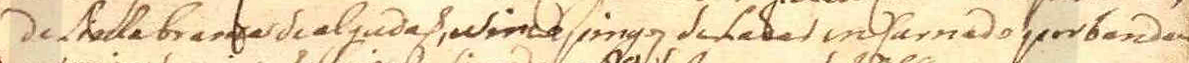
de Linha branca de algudaõ, e sinco pingos de Lacar enCarnado por banda
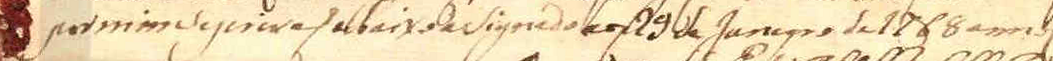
por mim escrivaõ abaixo aSignado aos 29 de Janeyro de 1768 annos
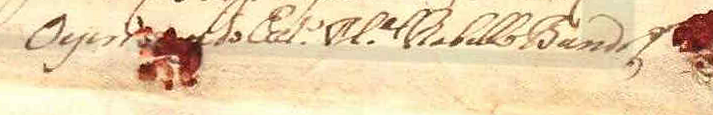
O escriv do Eccl.o M.el Rabello Bandaõ
